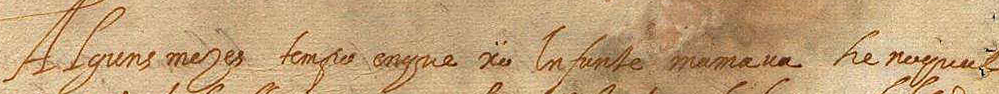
Alguns mezes tempo en que xo Infante mamaua he no qual
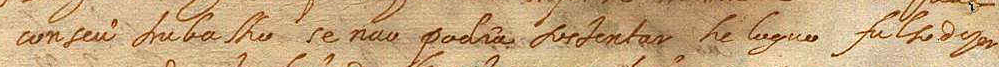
con seu trabalho se nao podia sostentar he loguo falso dizer
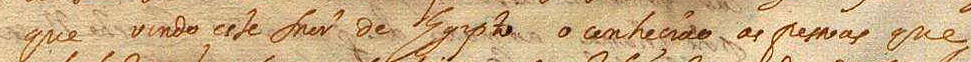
que vindo este snor̄ de Egipto o conhecião as pessoas que
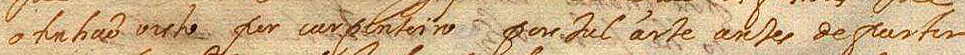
o tinhaõ visto por carpinteiro por tal arte antes de partir
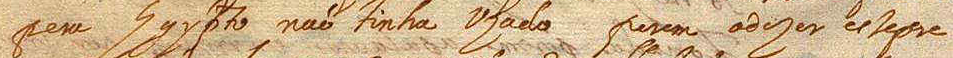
pera Egypto naõ tinha vzado porem o dizer este pre
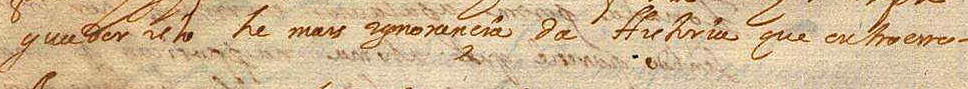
guador isto he mais ignorancia da Autoria que outro erro
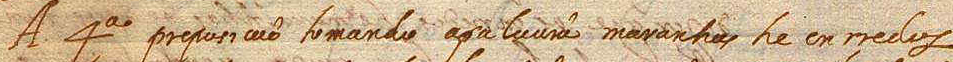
A 4a preposiçaõ tomando a palaura maranhas he enrredos
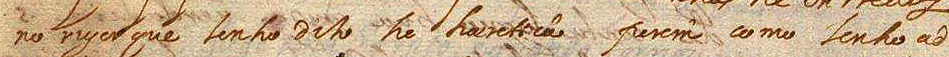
no rigor que tenho dito he hæretica porem como tenho ad
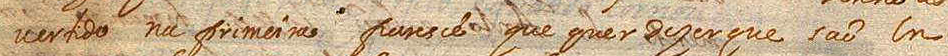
uertido na primeira paresce que quer dizer que saõ In
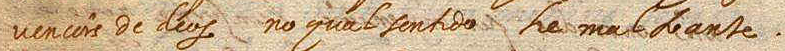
uençoĩs de deos no qual sentido he malsoante.
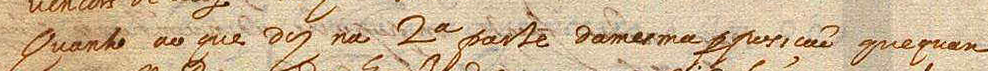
Quanto ao que diz na 2a parte da mesma ꝓposiçaõ que quan
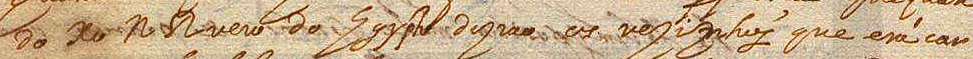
do Xo N Sr veio do Egypto diziao os uezinhos que era car
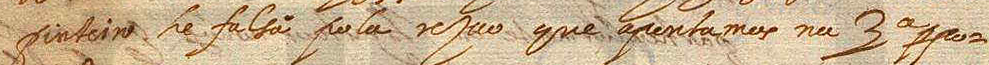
pinteiro he falsa pola rezao que apontamos na 3a ꝓpo
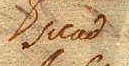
siçaõ
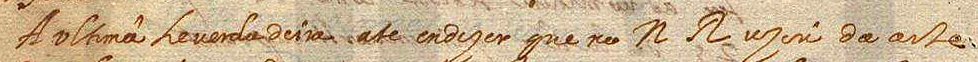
A vltima he uerdadeira ate endizer que xo N R uzou da arte
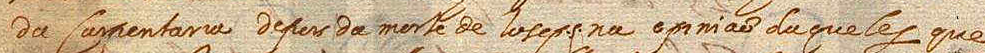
da Carpentaria depois da morte de Ioseph na opiniaõ daqueles que
